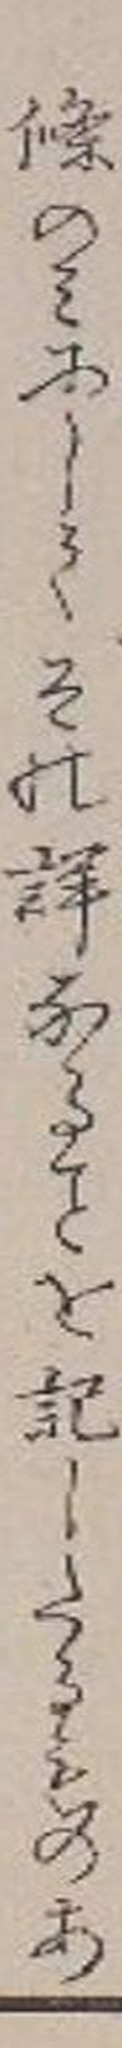条のみにして、その詳なることを記したるものあ
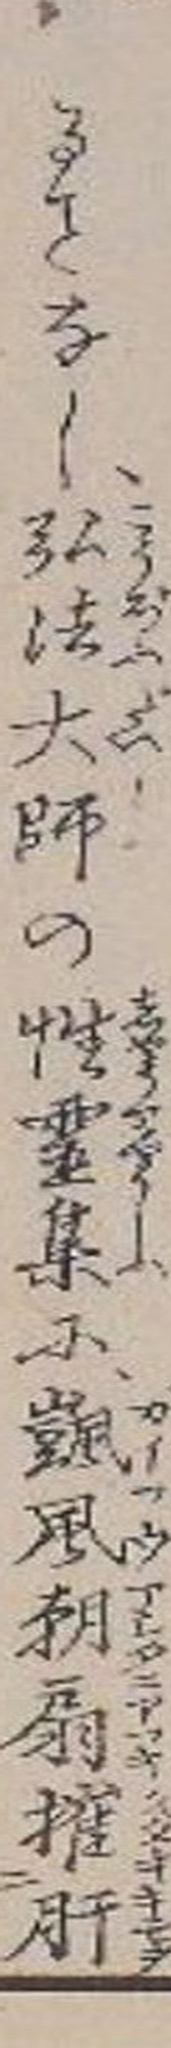ることなし、弘法大師の性霊集に凱風朝扇摧肝
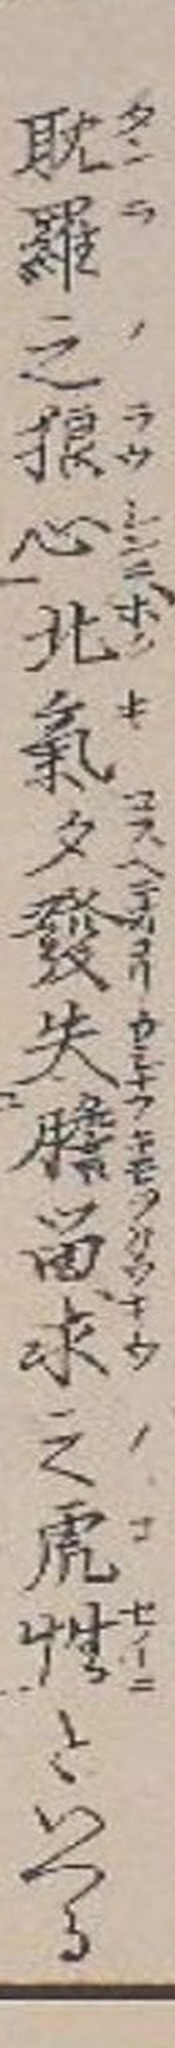耽羅之狼心、北気夕発失膽留求之虎性といへる
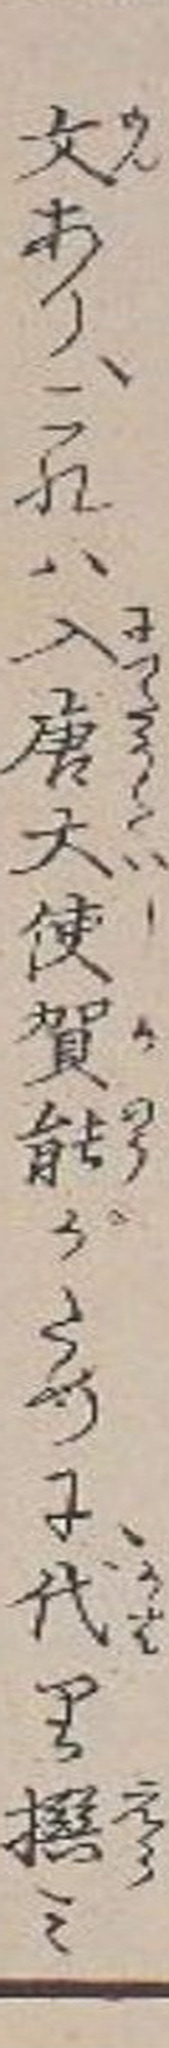文あり、これは入唐大使賀能がために、代り撰み
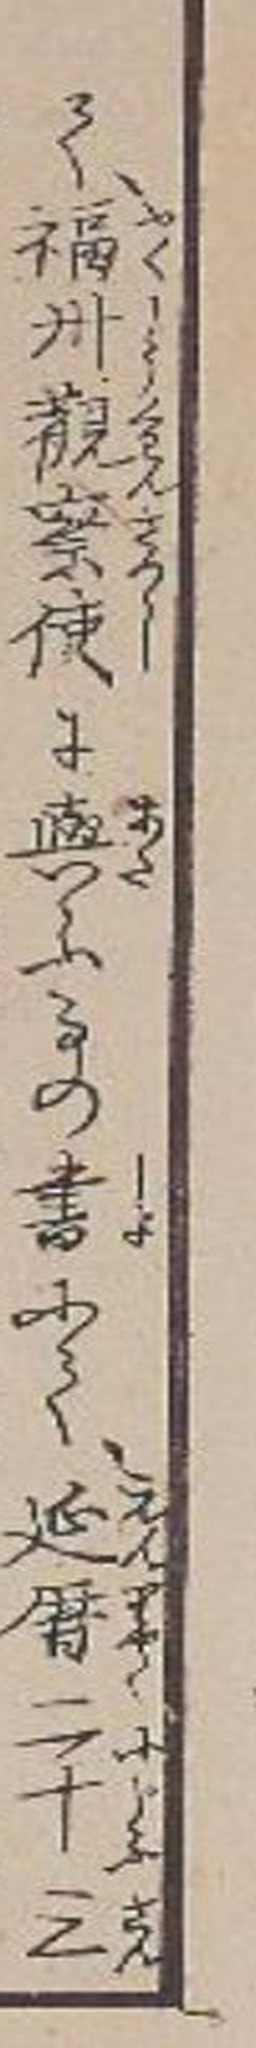て、福州観察使に与ふるの書にて、延暦二十三
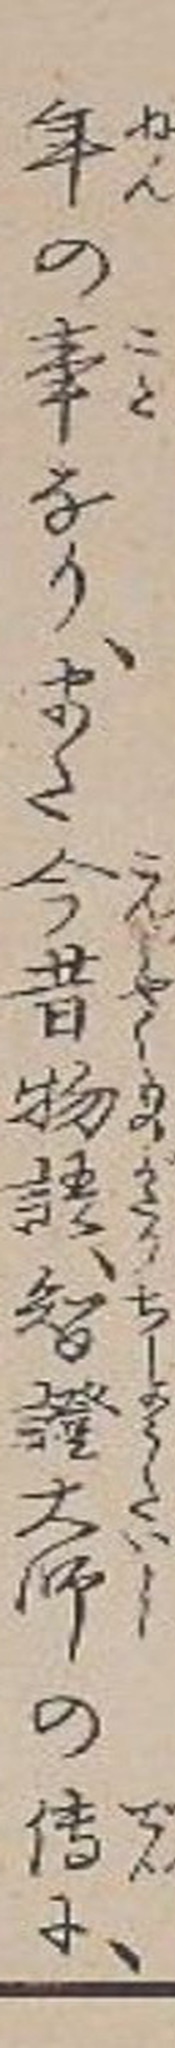年の事なり、また今昔物語、智証大師の伝に、
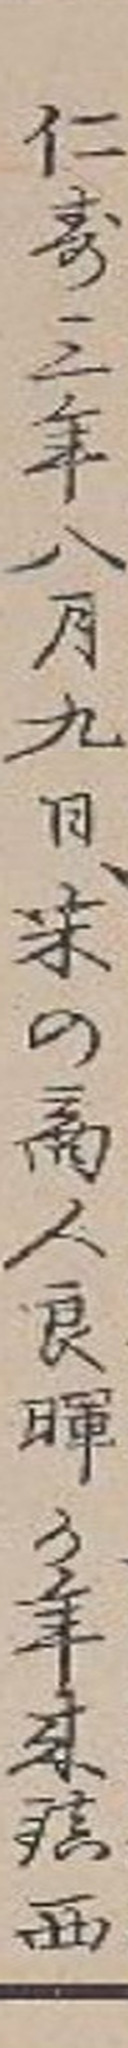仁寿三年八月九日、宋の商人良暉か、年来鎮西
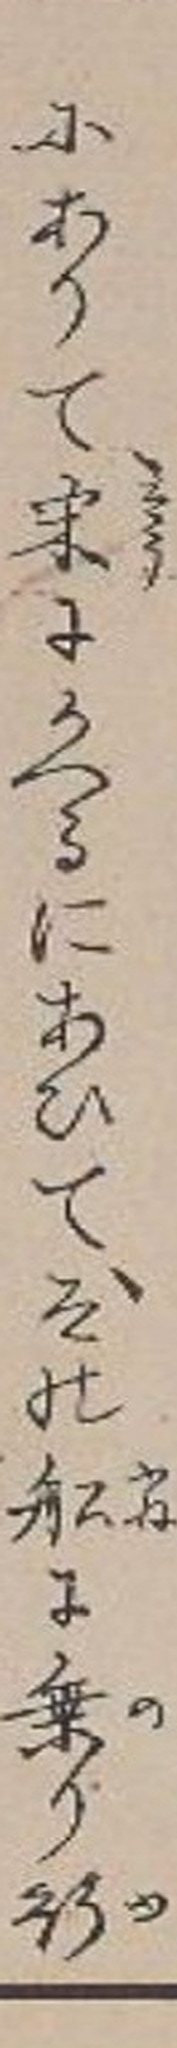にありて、宋にかへるにあひて、その船に乗り行
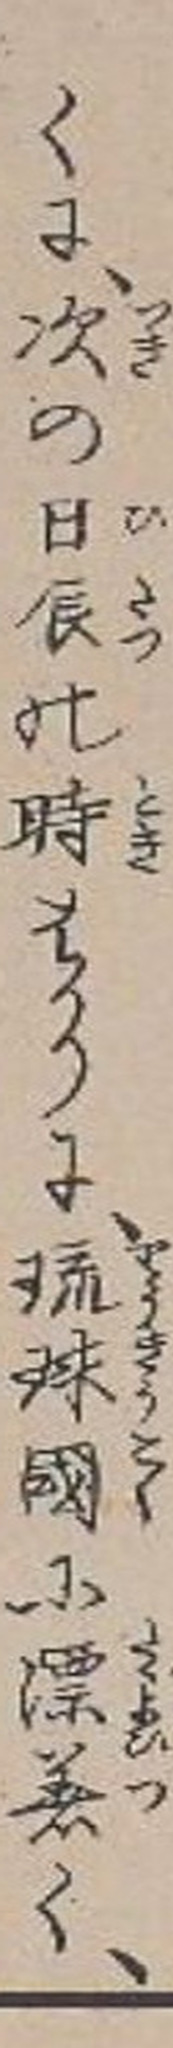くに、次の日辰の時はかりに、琉球国に漂着く、
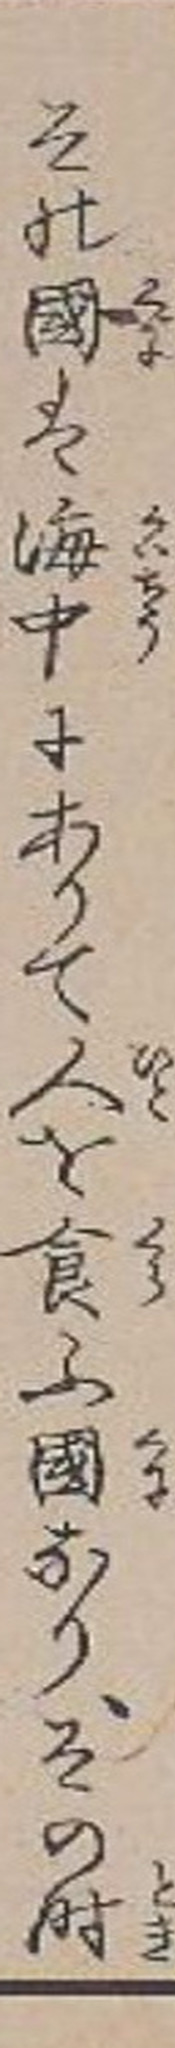その国は海中にありて人を食ふ国なり、その時
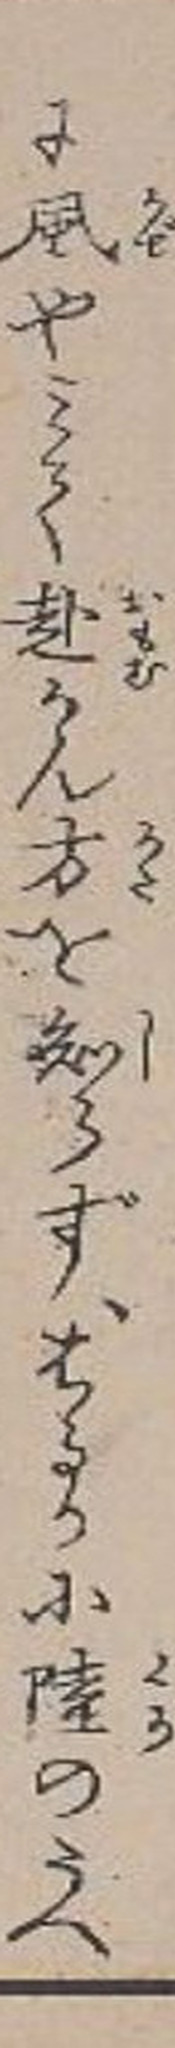に風やみて赴かん方を知らず、はるかに陸のうへ
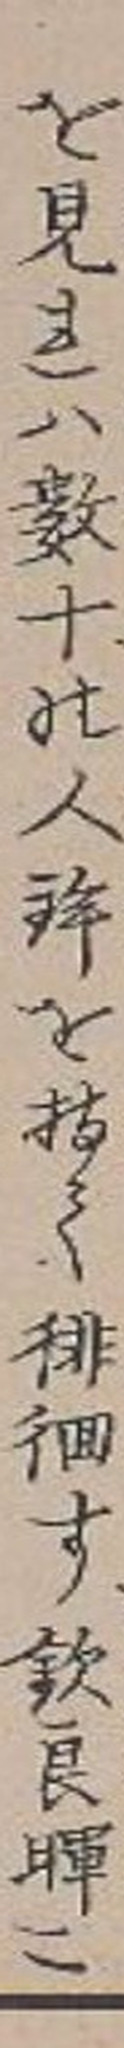を見れば数十の人鉾を持て徘徊す、欽良暉こ
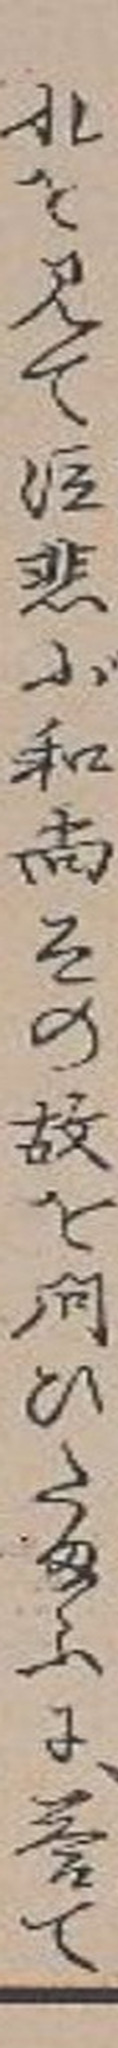れを見て泣悲ぶ、和尚その故を問ひたひたまふに、答て

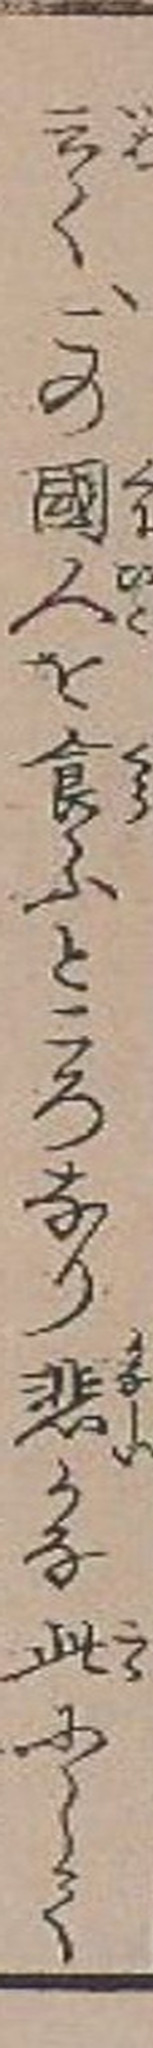云く、この国人を食ふところなり悲かな此にして
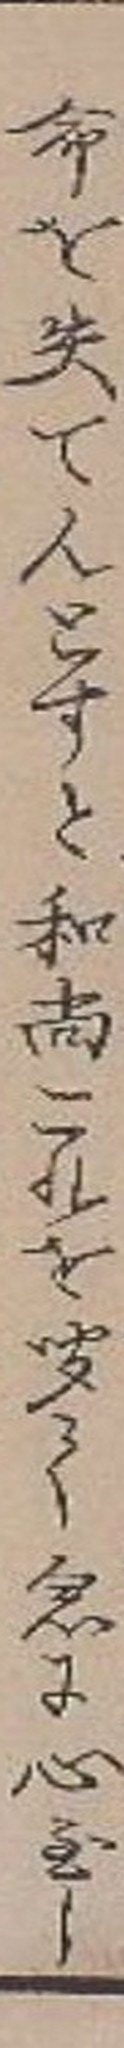命を失てんとすと、和尚これを聞て忽に心至し
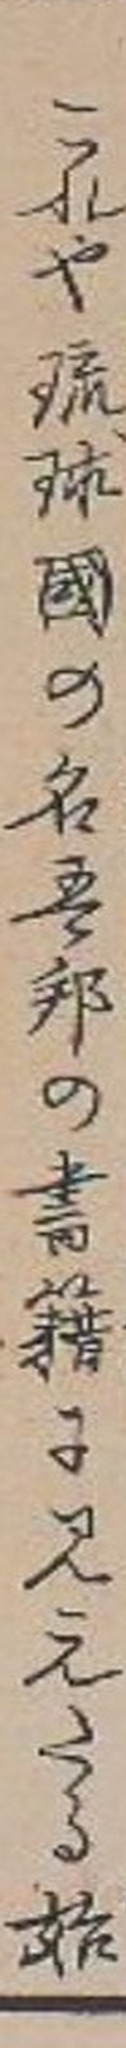これや琉球国の名、吾邦の書籍に見えたる始
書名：琉球入貢紀略
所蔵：University of the Ryukyus Library
